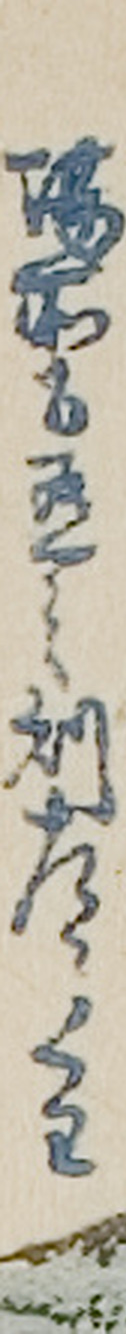場所も有之則左二くわ
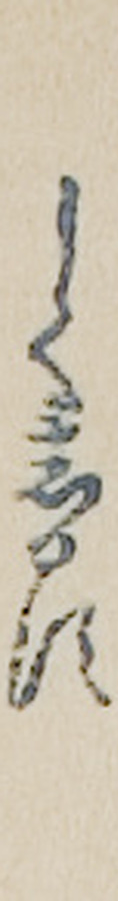しくしるす
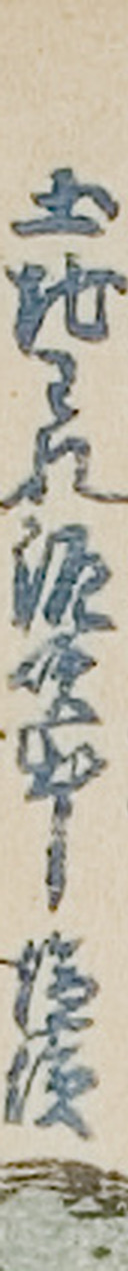土地われ泥水吹出し塩浜
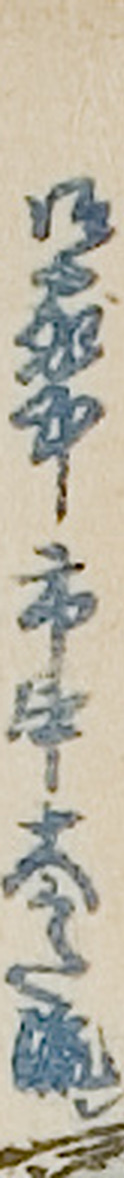御家中市中大かた流
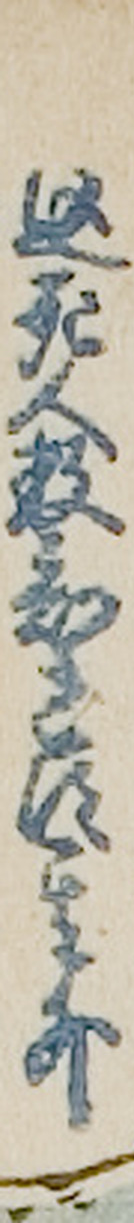込死人数しれす其外
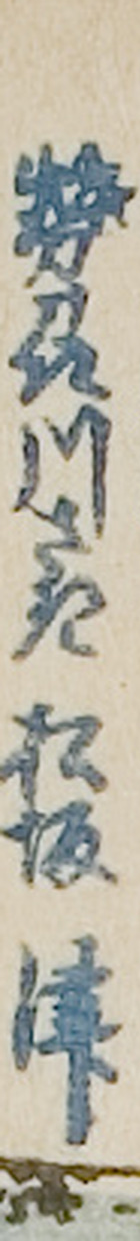勢州川さき松枝津
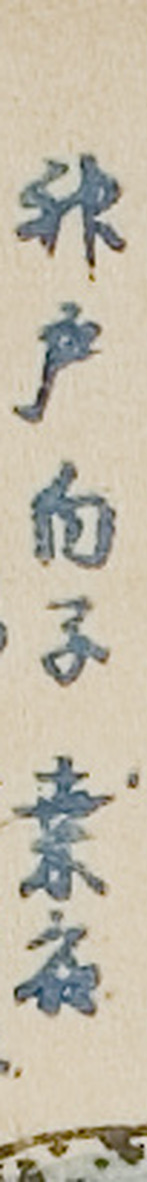神戸白子桑名
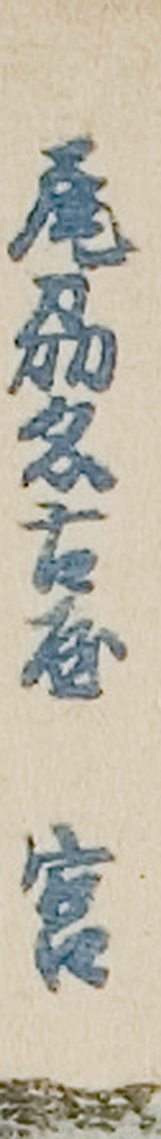尾州名古屋宮
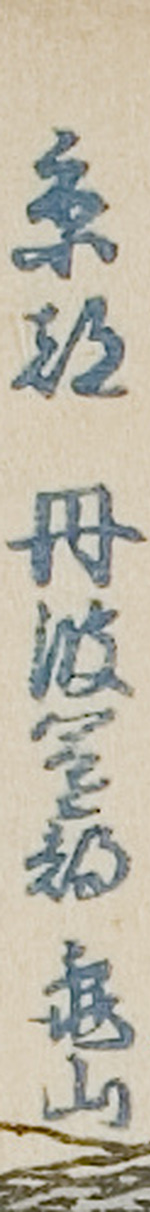京都丹後宮部亀山
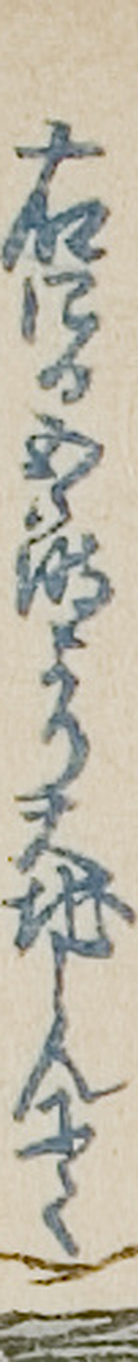右四口五ッ時より大地しんにて
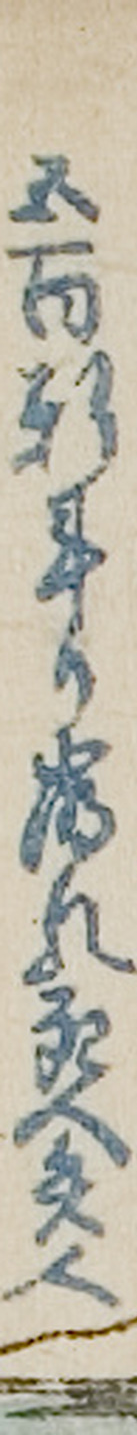五百軒斗り崩れ死人失人
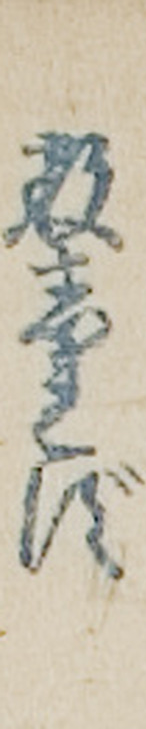数しれず
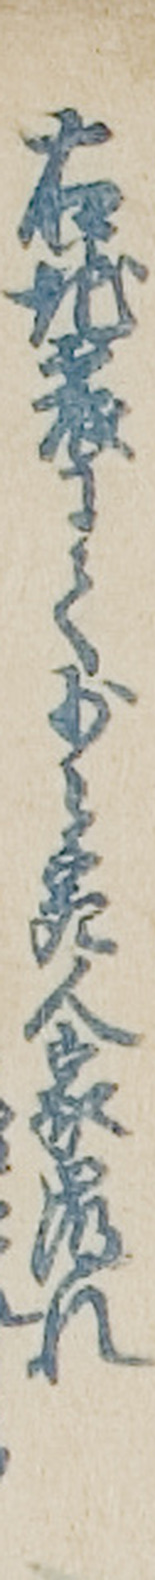右地震にて少々宛人家崩れ
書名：諸国大阪大地震大津波細見一覧
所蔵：東京大学総合図書館 General Library in the University of Tokyo, JAPAN
